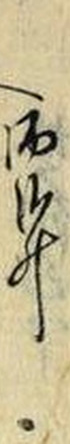酒弐升
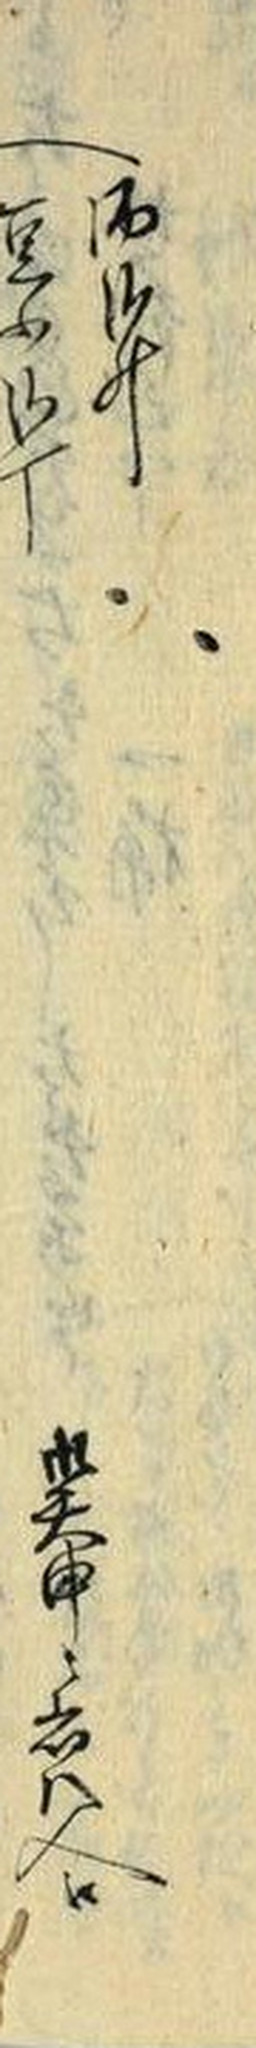豆ふ弐丁御矢申之者八人江
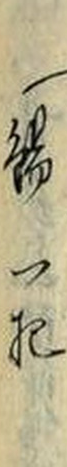鯣一杷
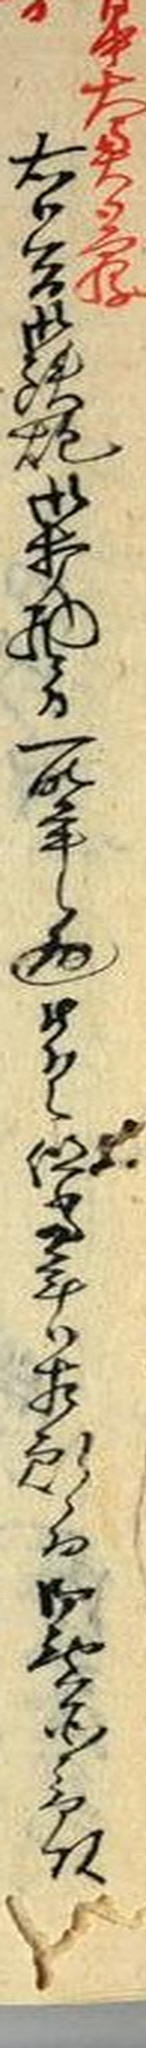右ハ今日御鉄炮御打納ニ付一昨年之通被下之但当年ハ相願候而御台所ニ而頂
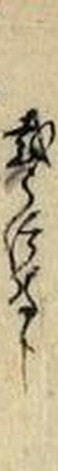戴被仰付之
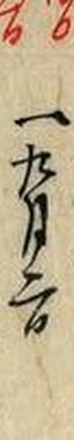一九月四日
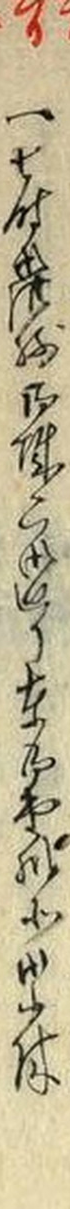一七時御供揃御城下御廻り東御堂掛所御小休
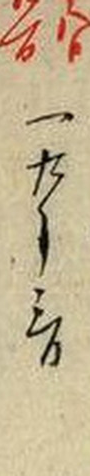一九月四日
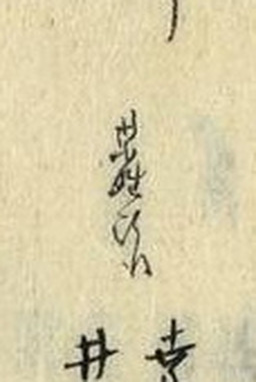御小姓頭取
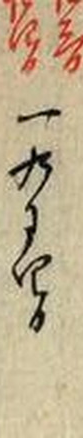一九月四日
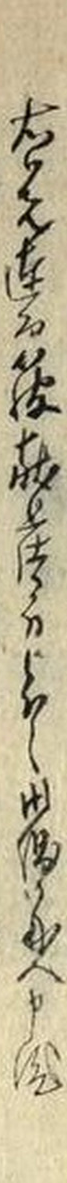右先達而箙献上仕候ニ付被下之御側御用人申渡
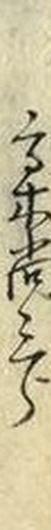高木尚三郎
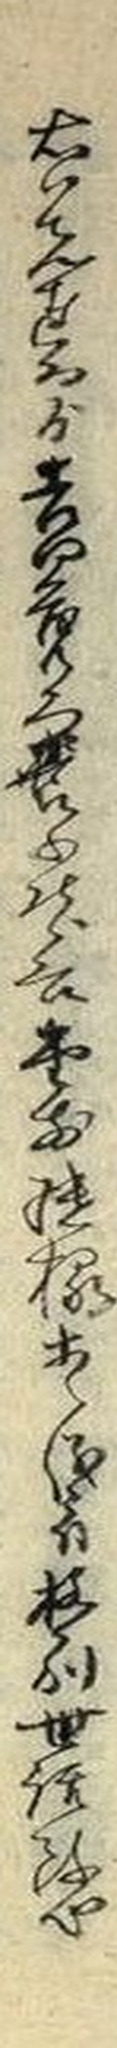右ハ先達而ゟ吉田茂右衛門養子次郎吉堂前継縁等之儀ニ付格別世話致心
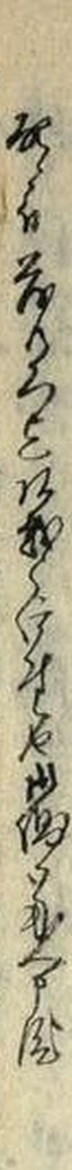配候ニ付茂右衛門迄頂戴被仰付候由御側御用人申渡
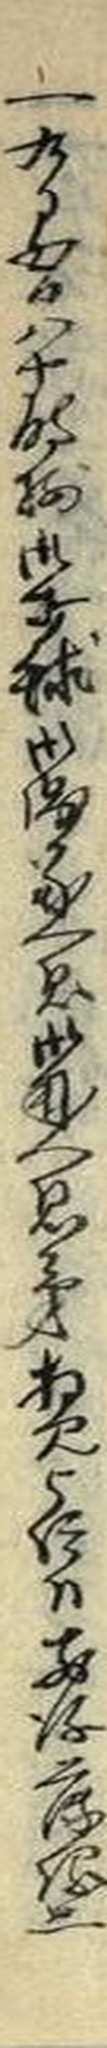一九月五日八半時揃御打毬御側御用人息御用人息弟拝見被仰付前後薄
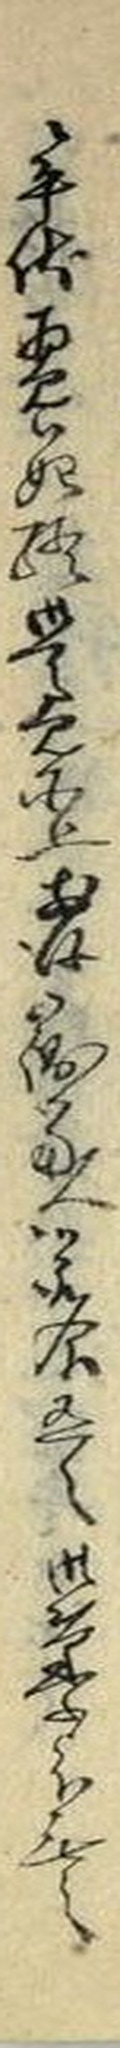ニ平伏拝見ハ始終御馬見所上前後御側御用人御取合有之御菓子被下無之
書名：少傅日録抄（斉承付側向頭取日記、在国）
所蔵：福井県文書館 Fukui Prefectural Archives
